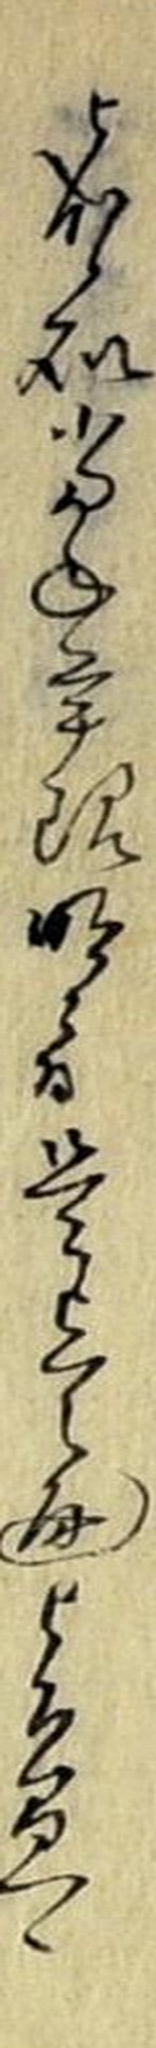被成候処当年年限明に付是迄之通被下置候
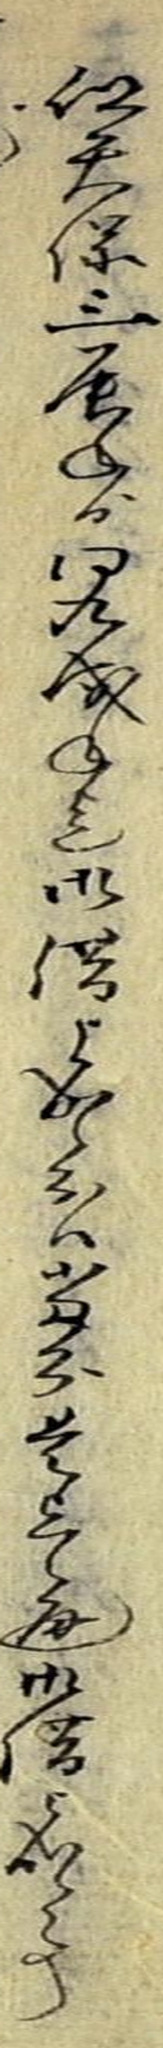但天保三辰年ゟ同九戌年迄御借被成候分は当分是迄之通御借被成候事
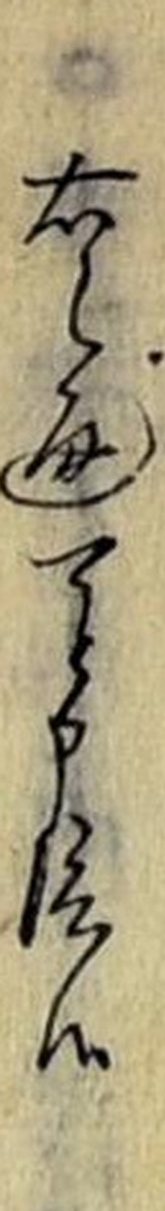右之通可被申渡候
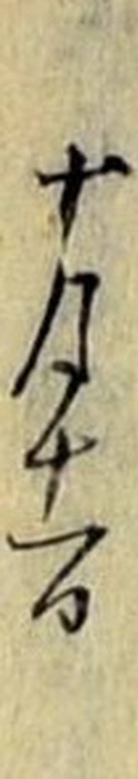十月十一日
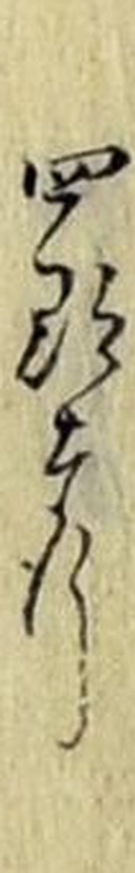四郡奉行
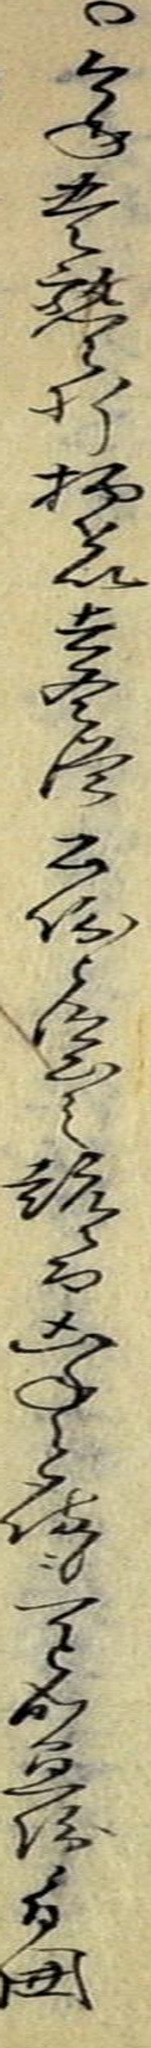○今年豊熟之折柄を以去冬従公儀被仰出候趣に而凶年之御備も可被成置儀に付囲
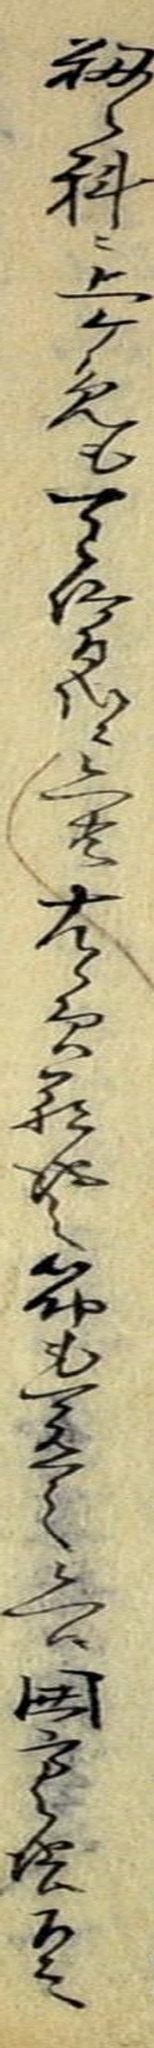籾之料に上ヶ免も可被仰付哉に候へ共左候而は難儀之筋も可有之候へは囲方之儀は下々
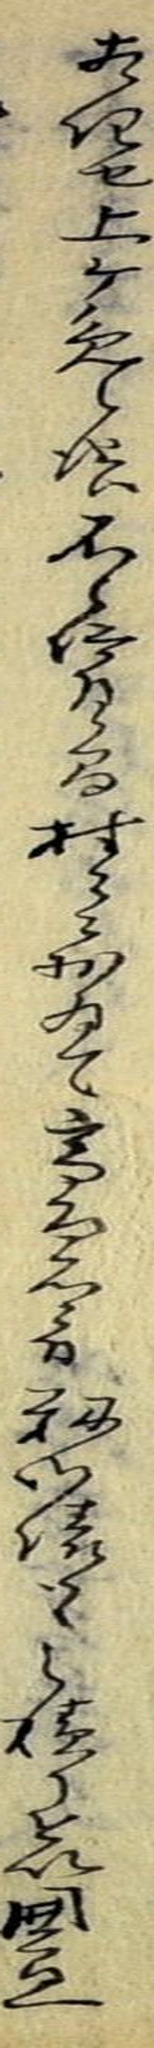相任上ヶ免之儀は不被仰付候間村々におゐて高百石に付籾弐俵之積りを以囲置
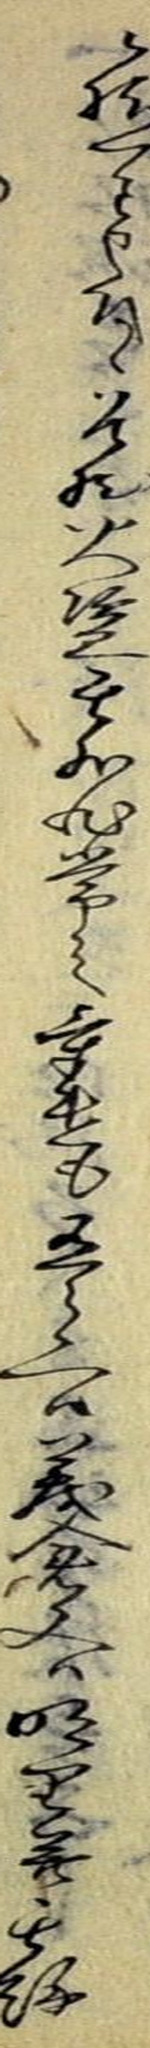候様可被申付候乍然火壁其外非常之気遣も有之候へは義倉又は明里并其餘
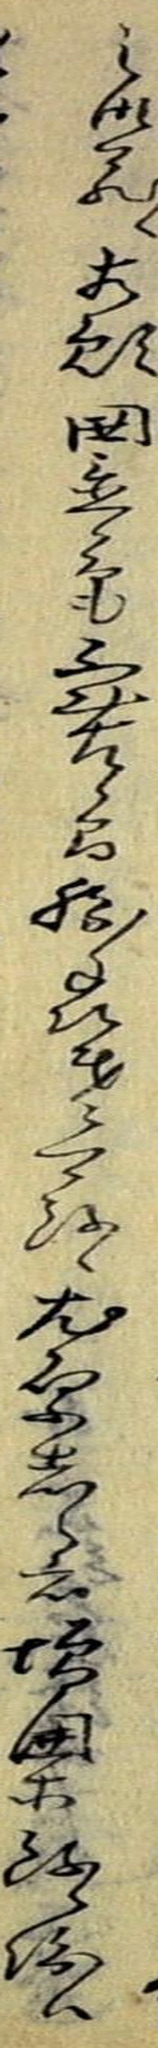之御蔵へ相願囲置候而も不苦候間勝手次第に可致候尤厚志之者増囲等致候儀は
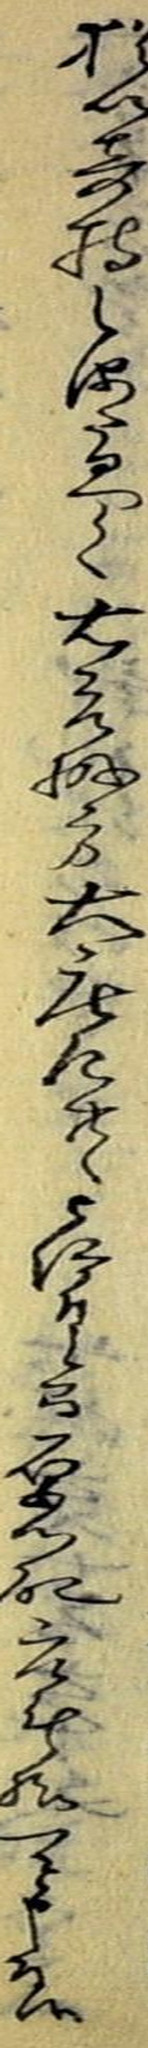猶以奇特之儀たるへく右取扱方大庄屋共へ被申付候間厚心配取斗候様可被申付候
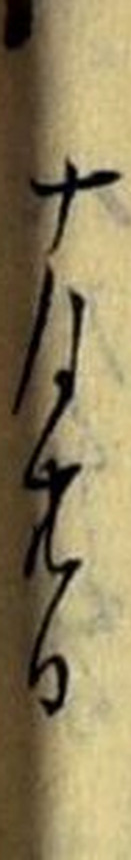十月廿日
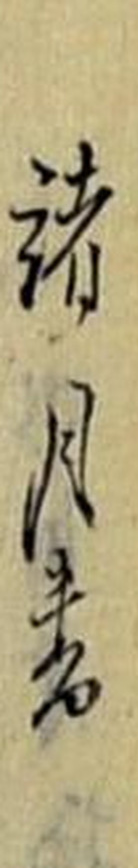諸月番
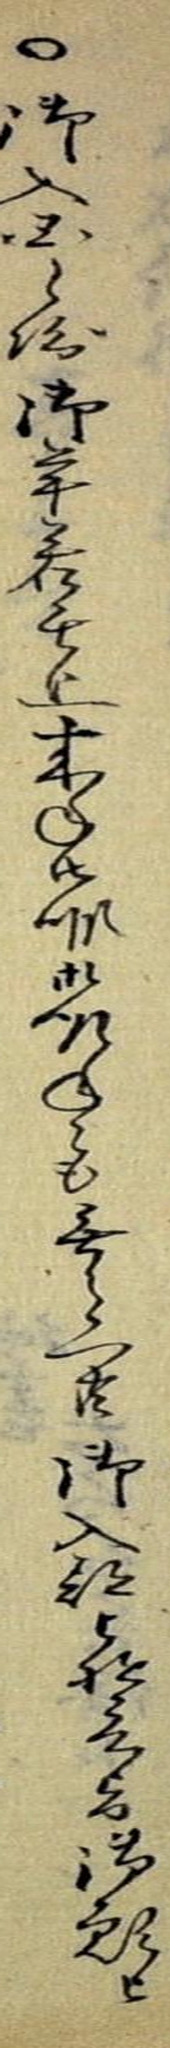○御入国之儀御年若其上来年御暇御順年にも無之候へ共御入部被遊度旨御願被
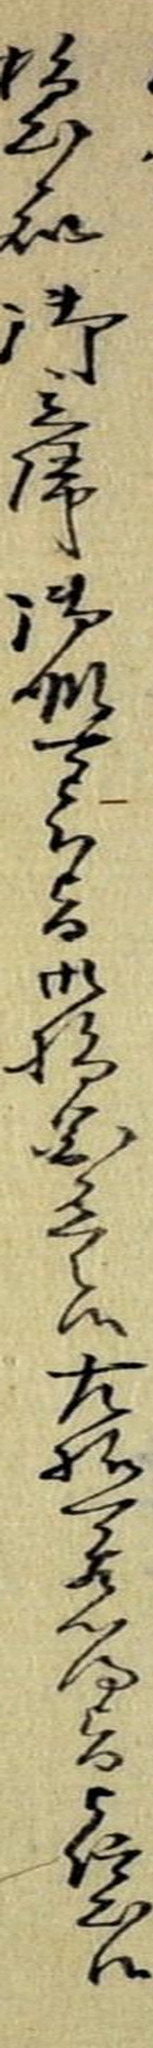指出候処御立帰御暇可被下旨御指図有之候左様可相心得旨被仰出候
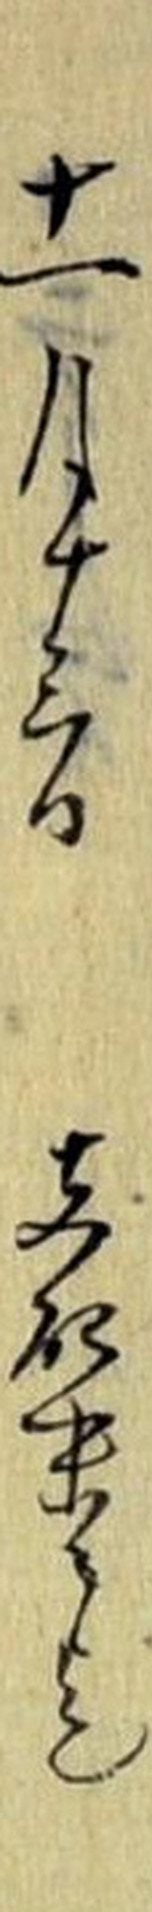十一月十三日支配末々迄
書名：命令之部 六
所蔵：福井県文書館 Fukui Prefectural Archives
